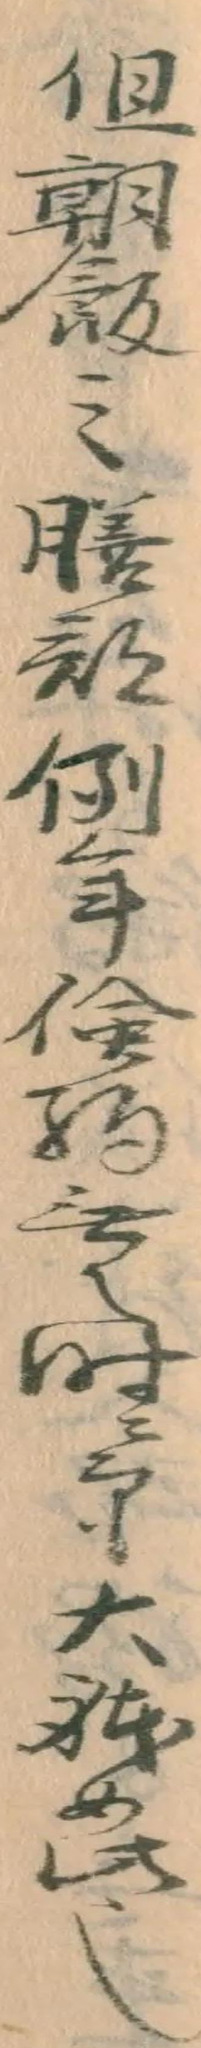但朝飯之膳部例年倹約無之時ニ而も大体如此也
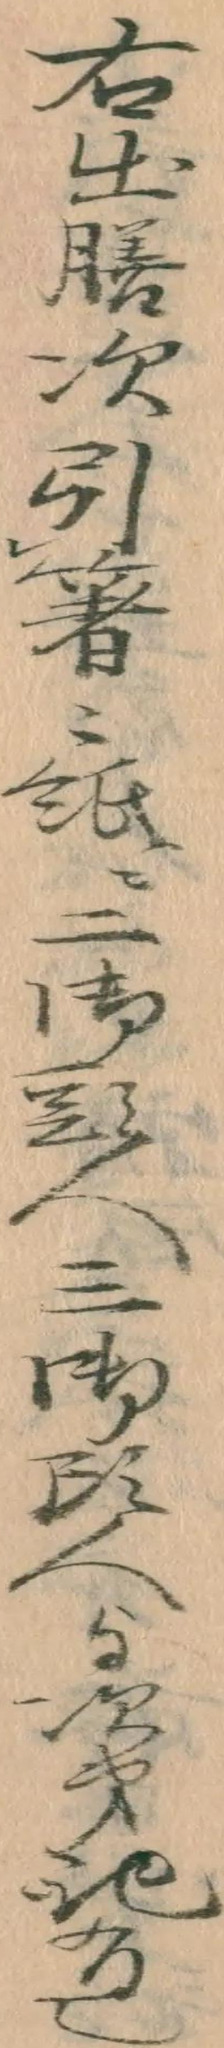右出膳次引著々紙ニ二頭人三御頭人と次第記有之
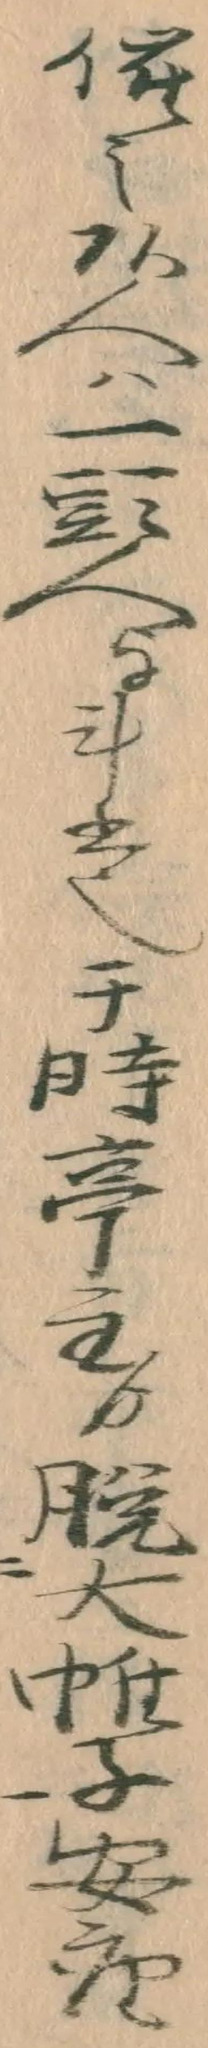催之頭人ハ一頭人と斗書也于時亭主ゟ脱大帷子安座
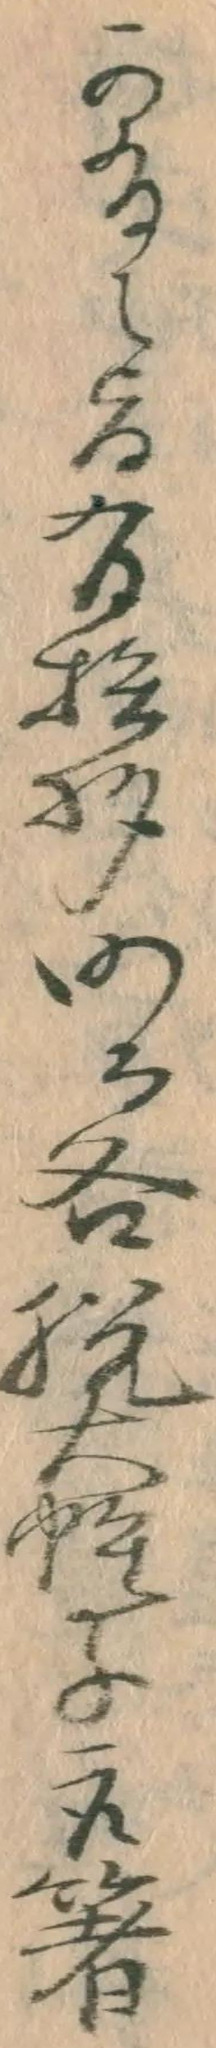可有之旨有挨拶仍而各脱大帷子取箸
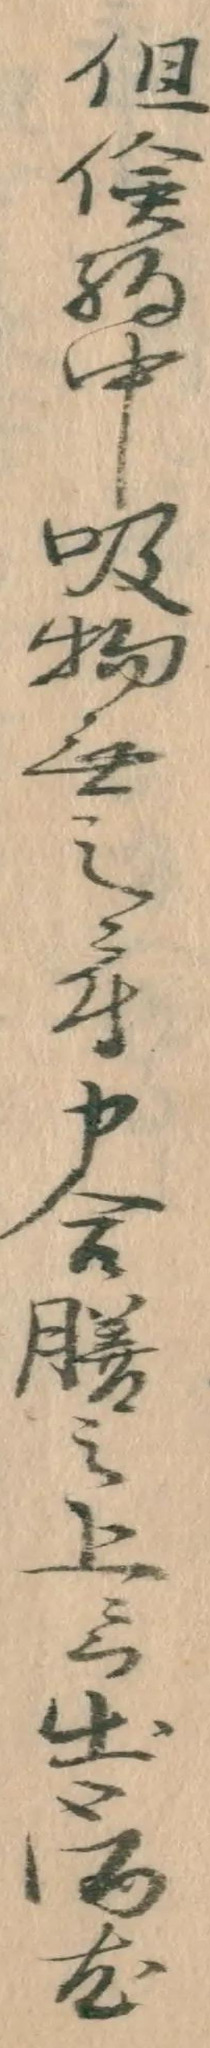但倹約中吸物無之ニ付申合膳之上ニ而出御酒尤
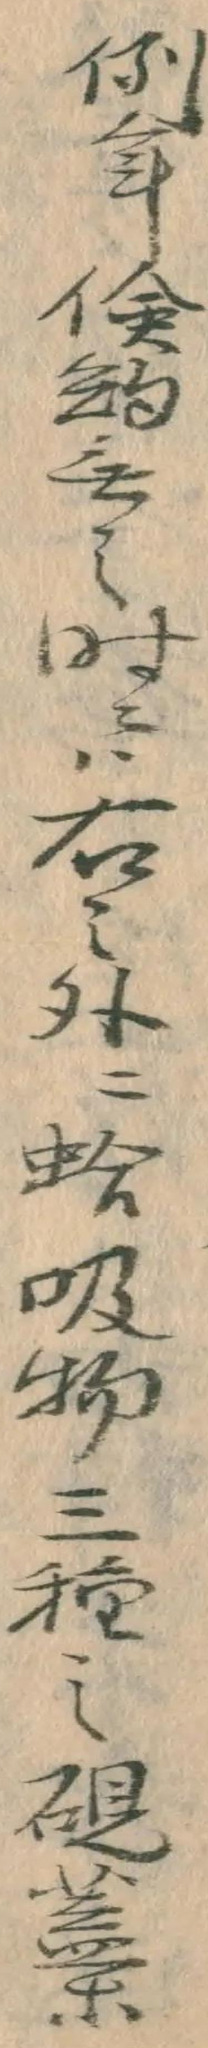例年倹約無之時ニハ右之外二蛤吸物三種之硯蓋等
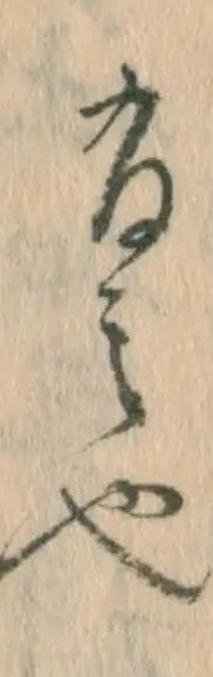有之也
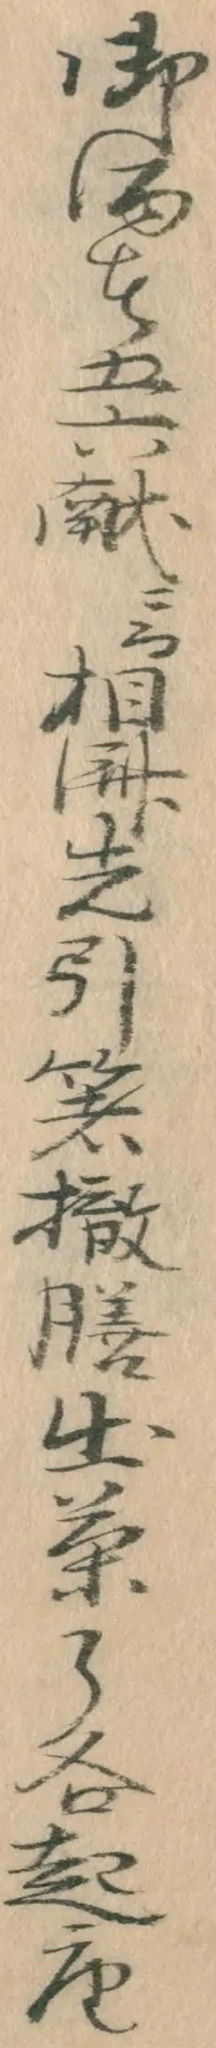御酒は五六献ニ而相済先引箸撒膳出茶了各起座

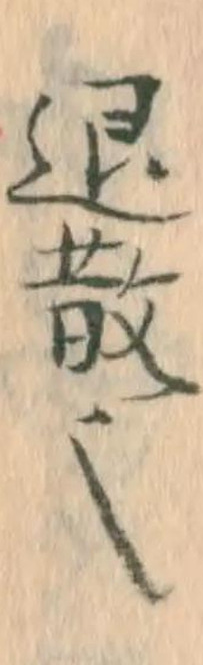退散也
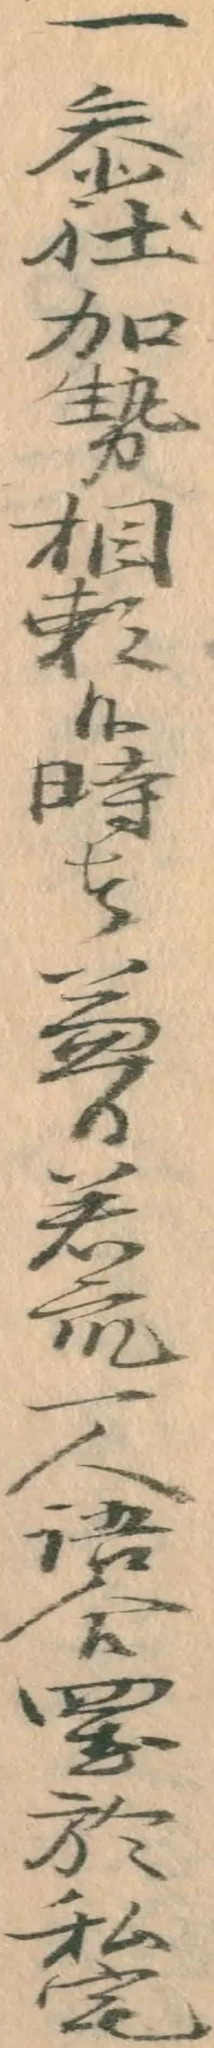一参社加勢相頼候時者兼而若衆一人語合置於私宅
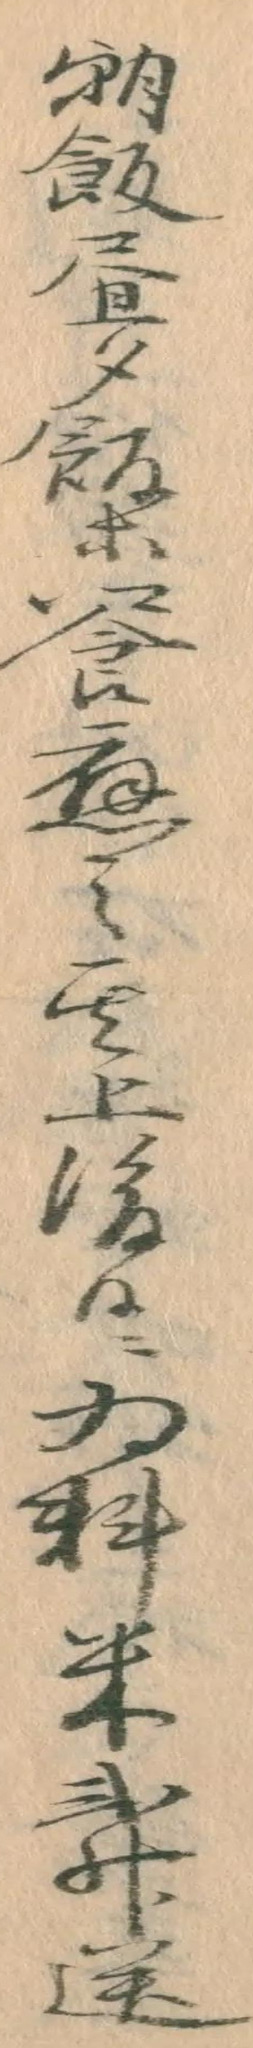朝飯昼夕飯等饗應之其上後日ニ為料米弐升送
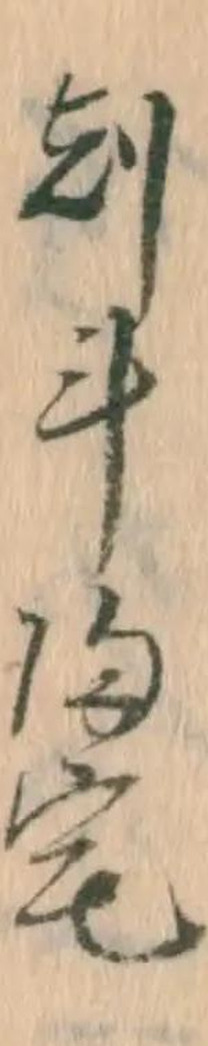刻斗帰宅
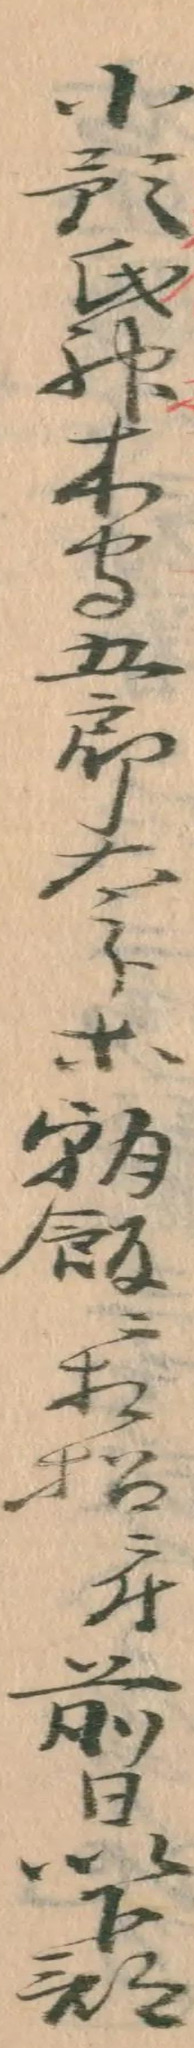一小預氏神木守五郎太郎等朝飯に相招ニ付前日以下部
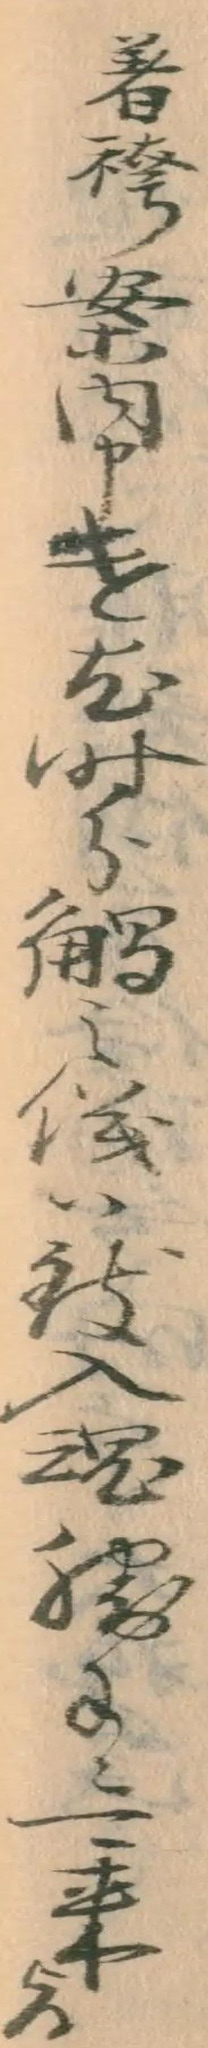着袴案内申遣尤時分觸之儀ハ致入魂勝手ニ可来旨
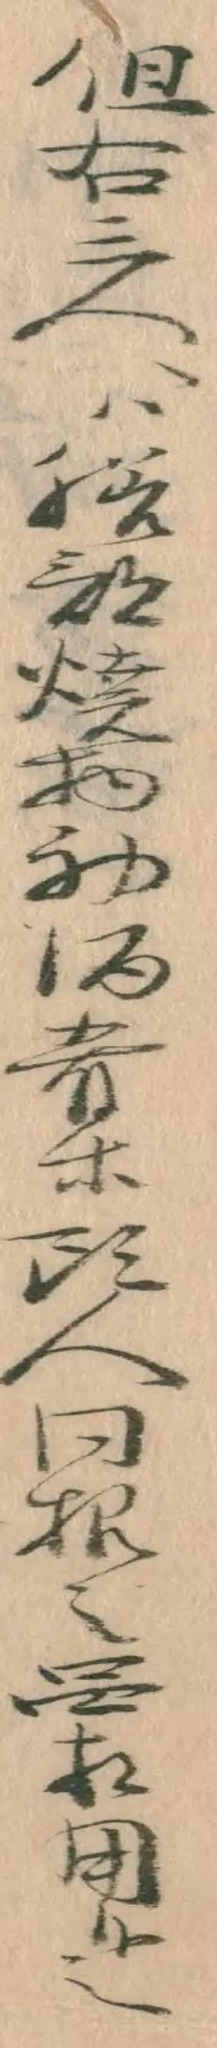但右三人ヘハ膳部焼物初酒肴等頭人同様之品相用候也
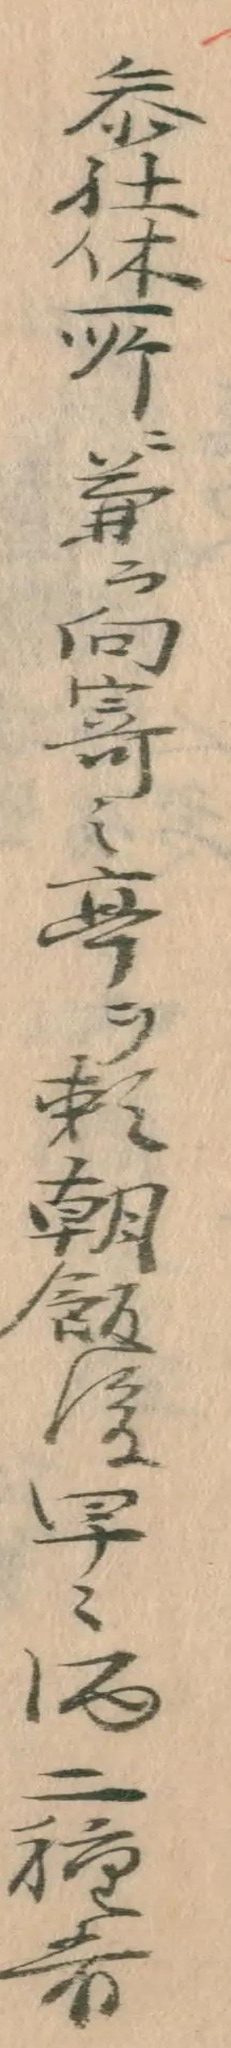一参社休所ニ兼而向寄之亭ヲ頼朝飯後早々酒二種肴
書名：賀茂社記録. 第72冊
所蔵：国立国会図書館 National Diet Library, JAPAN
